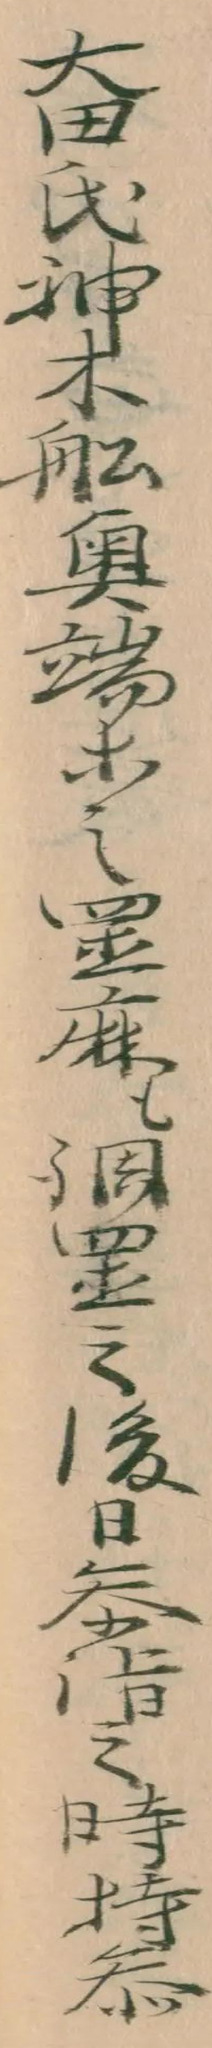大田氏神木舩奥端等之置麻も調置之後日参詣之時持参
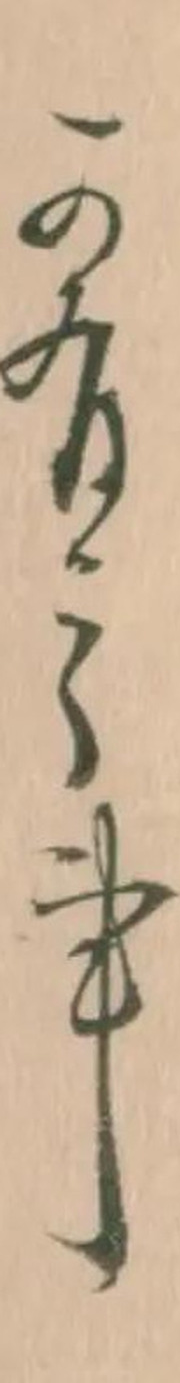可有之事
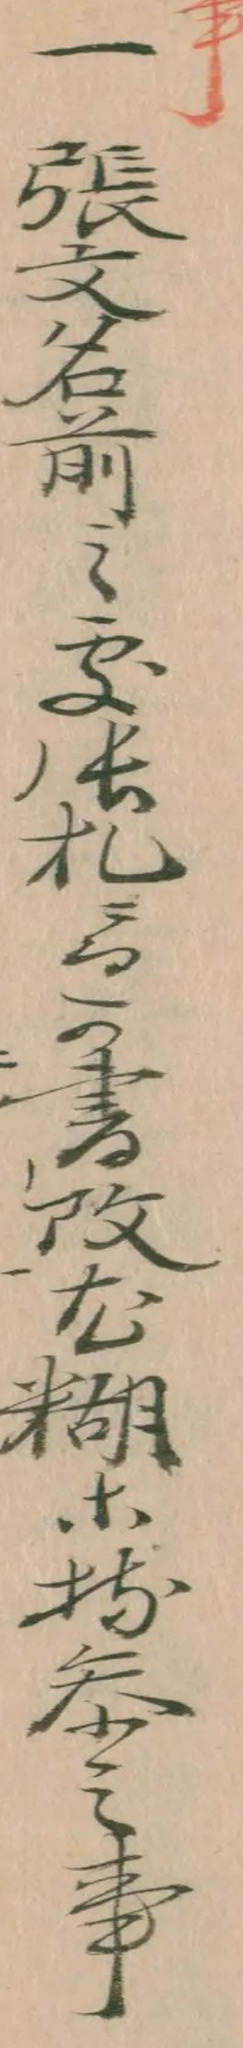一張文名前之處張札ニ而可書改尤糊等持参之事
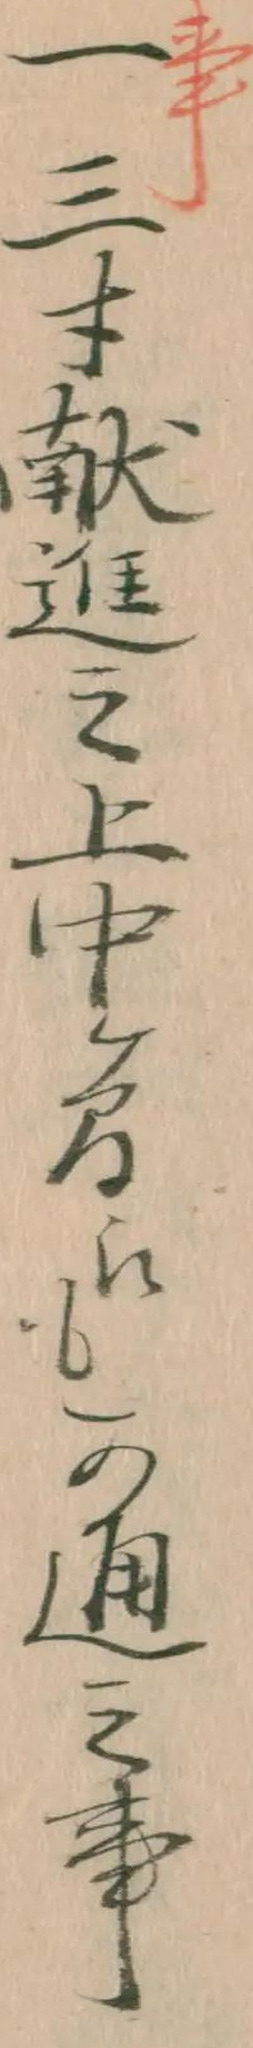一三寸献進之上中ケ間えも可通之事
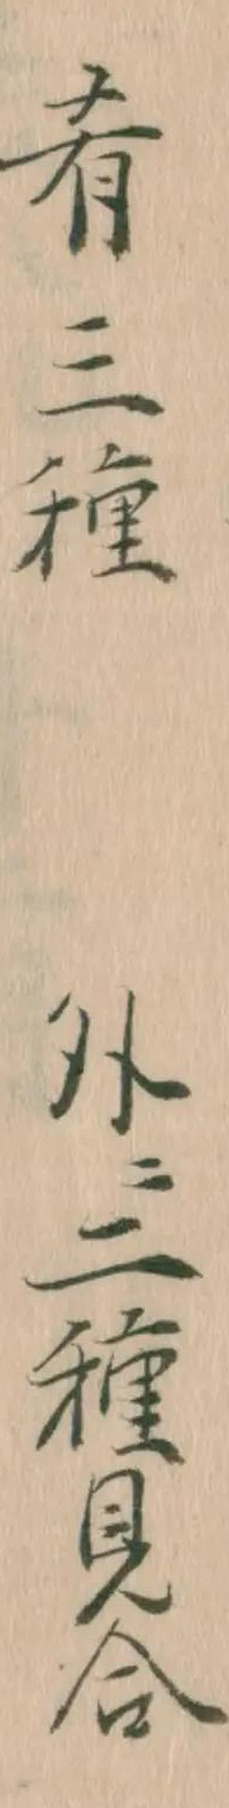肴三種外ニ二種見合
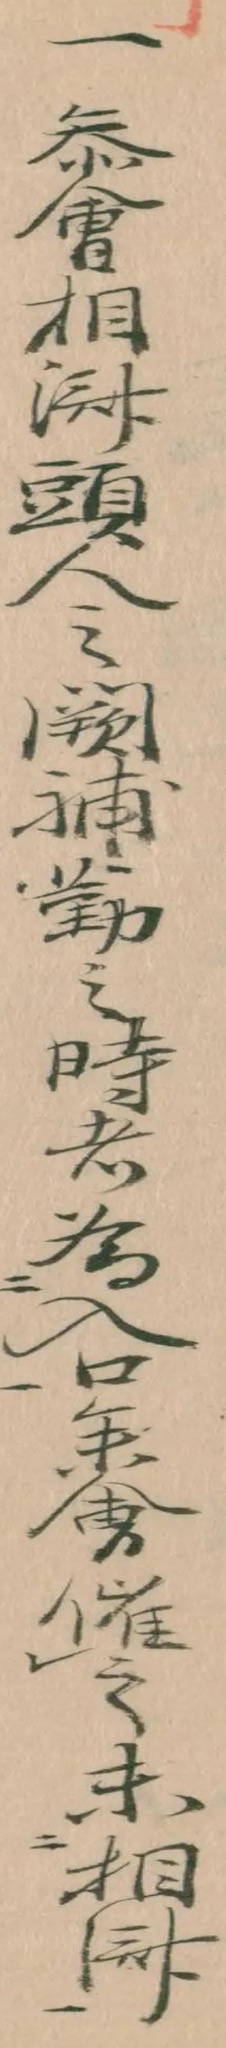一参會相済頭人之闕補勤之時者為入口参會催之未相済
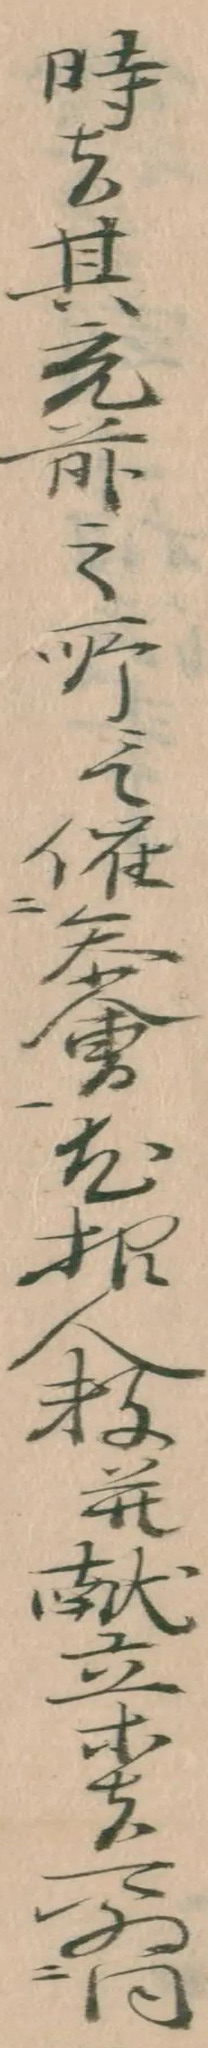時者其充前之所ニて催参會尤招人数并献立等者可為同
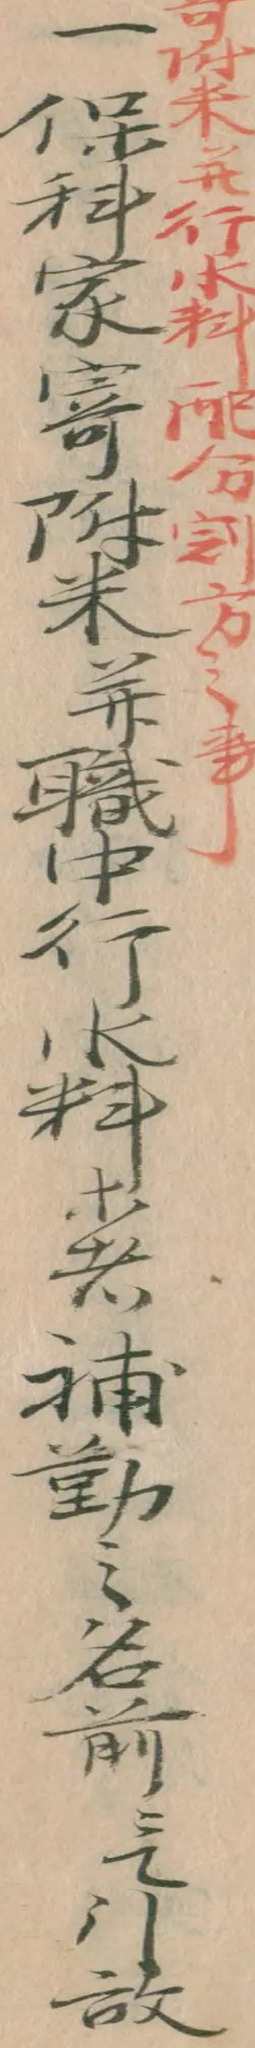一保科家寄附米幷職中行水料等は補勤之名前にて引故
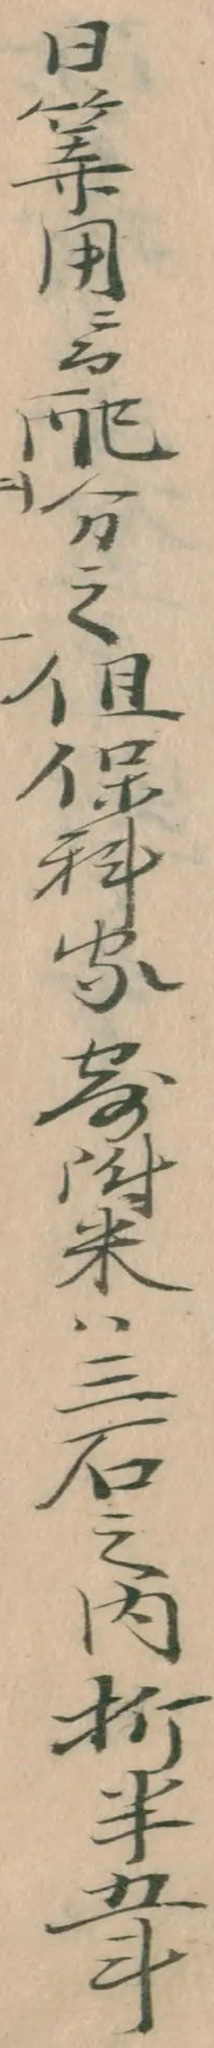日算用ニ而配分之但保科家寄附米ハ三石之内折半五斗

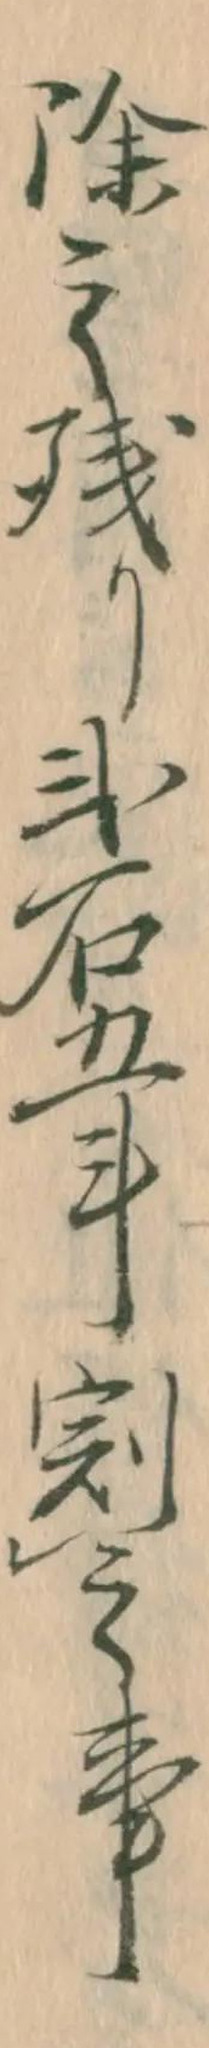除之残リ弐石五斗割之事
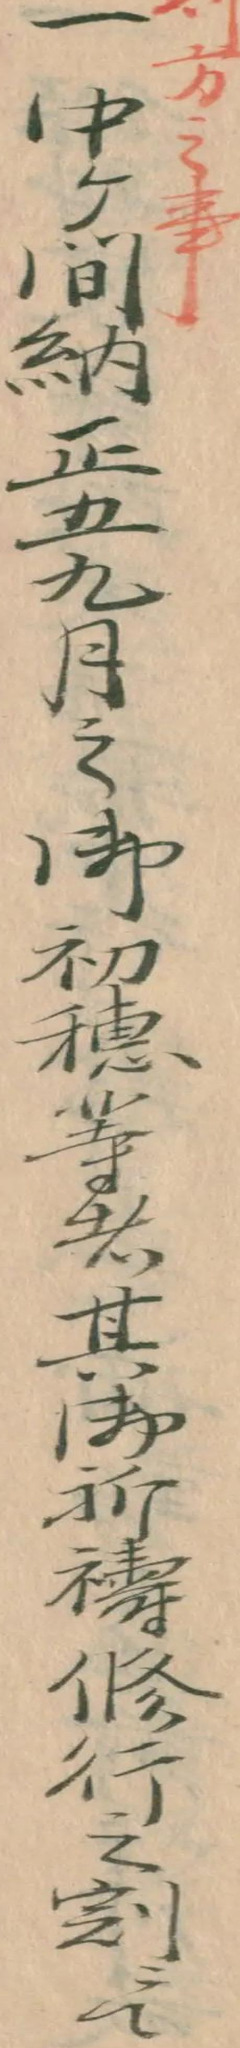一中ケ間納正五月之御初穂等者其御祈祷修行之割ニて
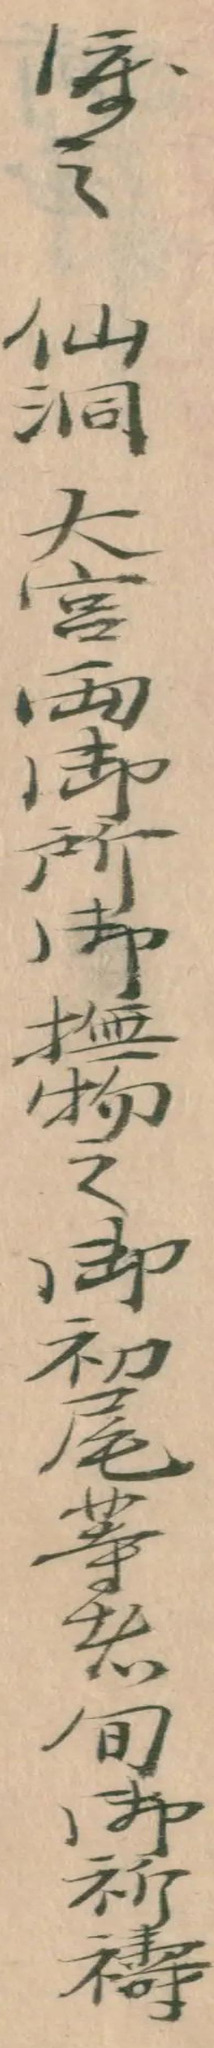渡之仙洞大宮両御所御撫物之御初尾等は旬御祈祷
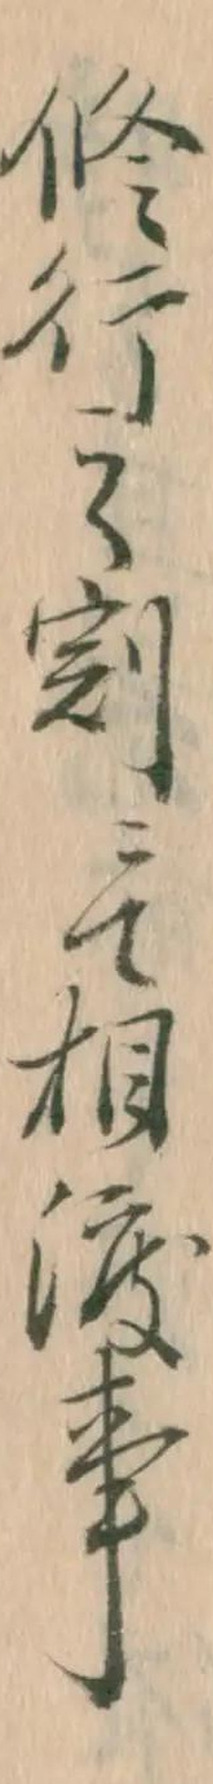修行之割ニて相渡事
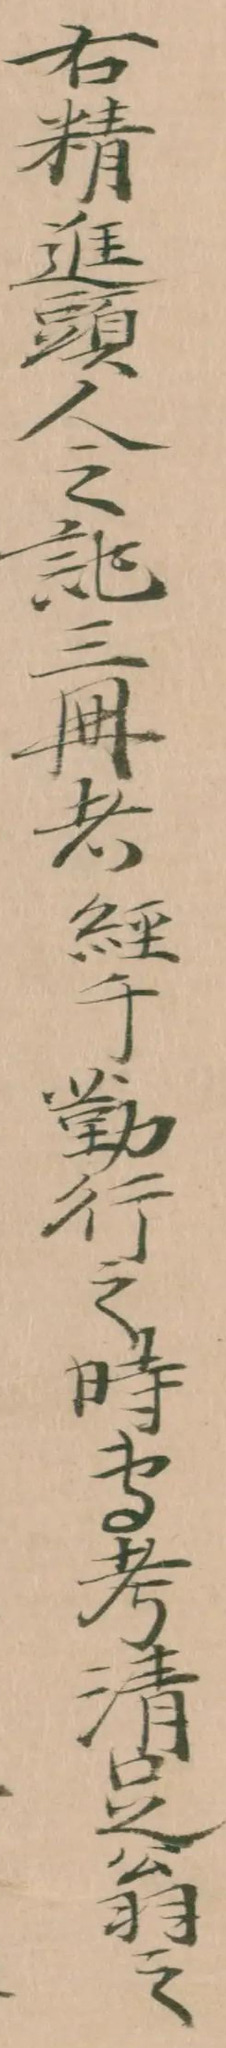右精進頭人之記三冊者経于勤行之時専考清足翁之
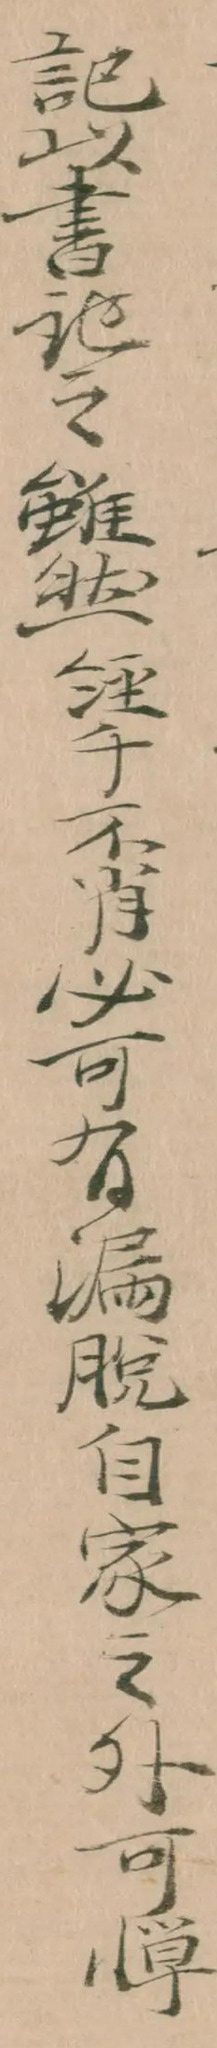記以書記之雖然経手不肖必可有漏脱自家之外可憚
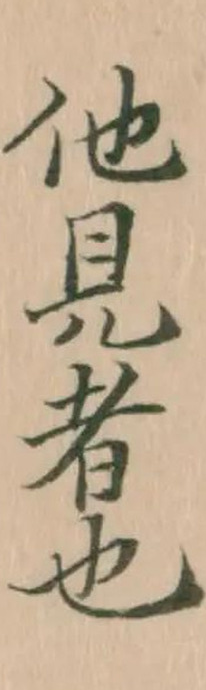他見者也
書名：賀茂社記録. 第74冊
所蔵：国立国会図書館 National Diet Library, JAPAN
